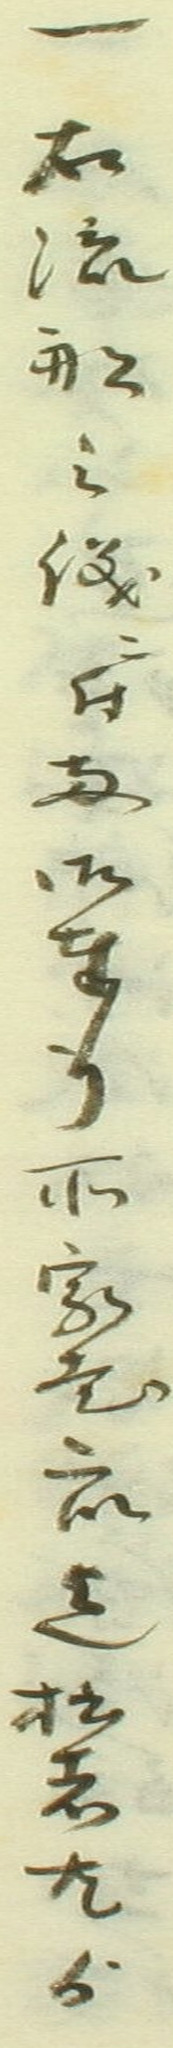一右流船之儀に付両御奉行所家老衆迄拙者共より
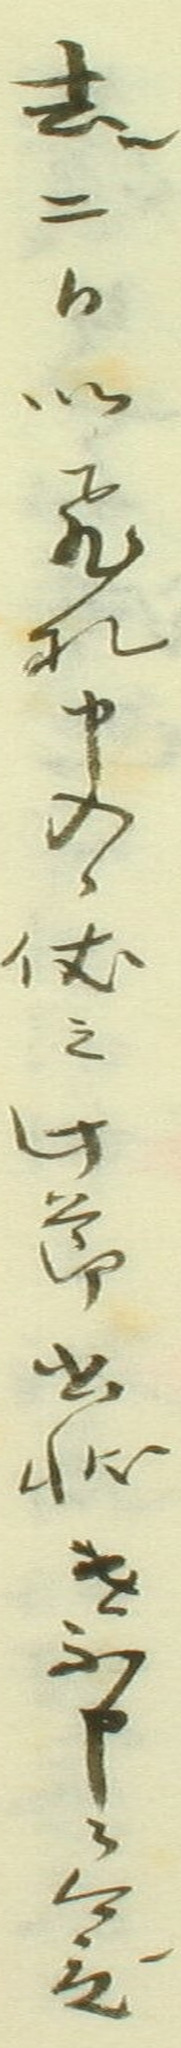去る二日以飛札申入候依之此節書状遣不申候今度
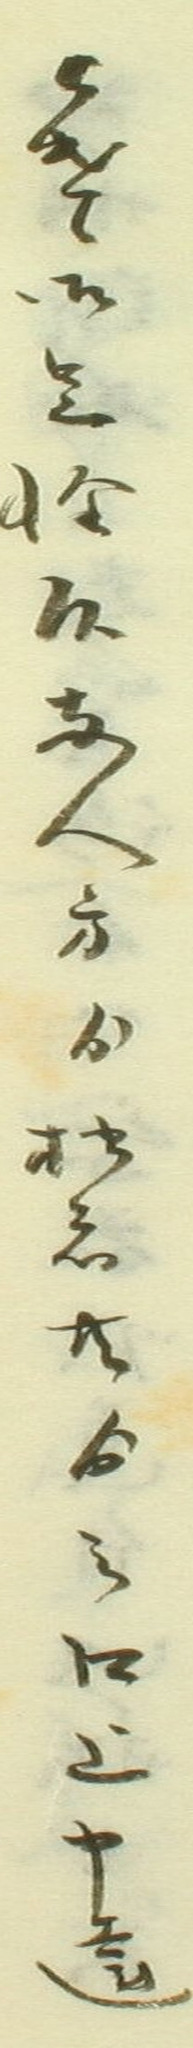被遣候御足軽頭両人方より拙者共より之口上申達
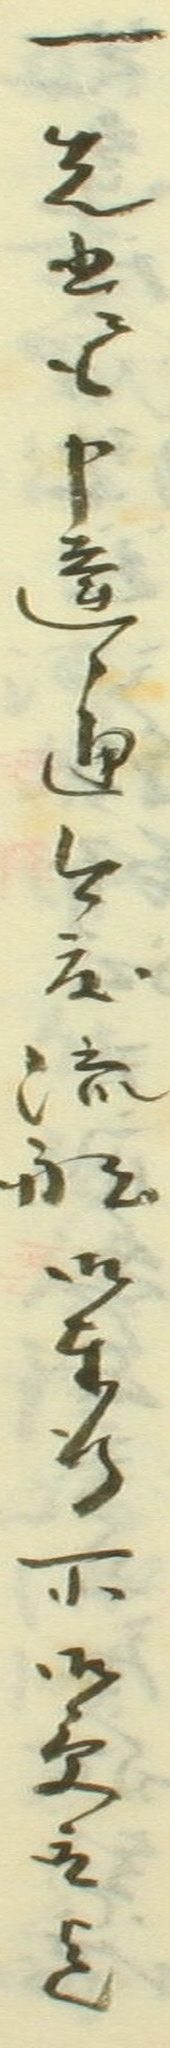一先書にも申達候通今度流船御奉行所御受取迄
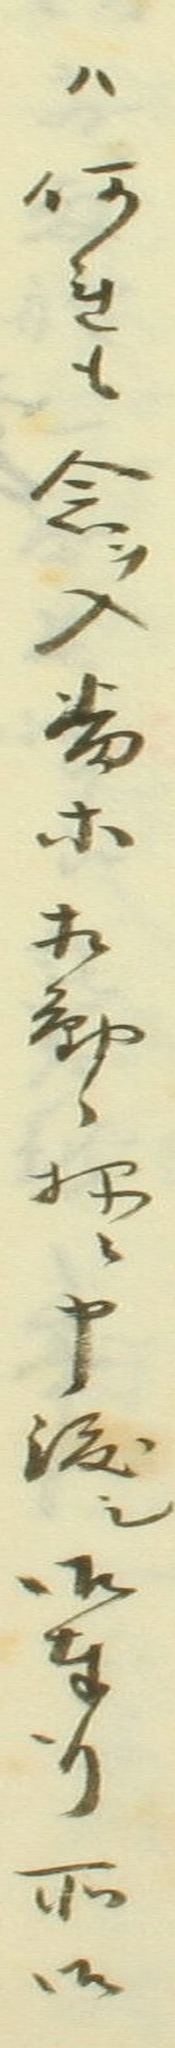は何れも念を入番等相勤候様に申渡し御奉行所御
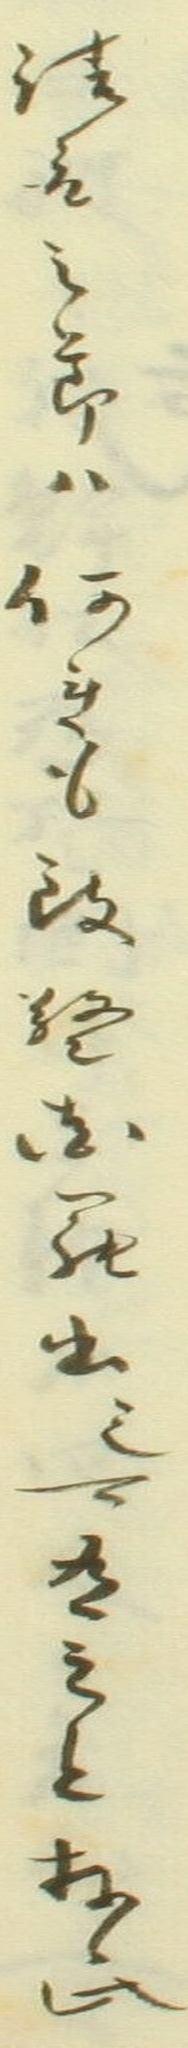請取之節は何れも致警固罷出し可有之と存候此
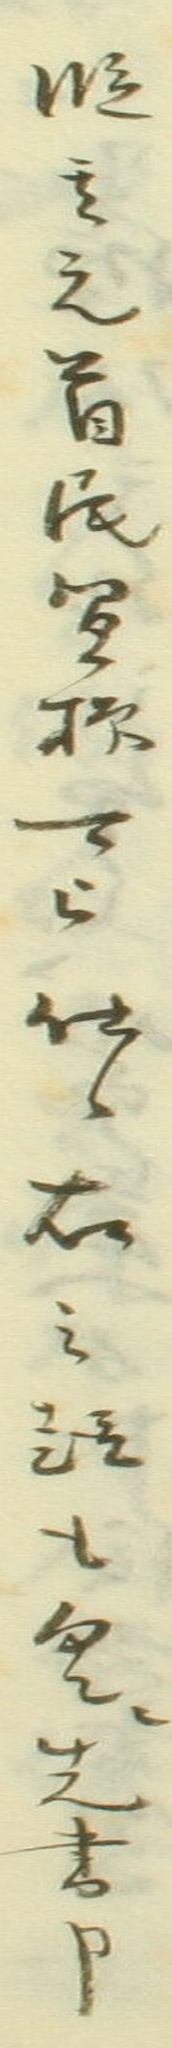段其元首尾宜様可被仕候右之趣も具に先書申
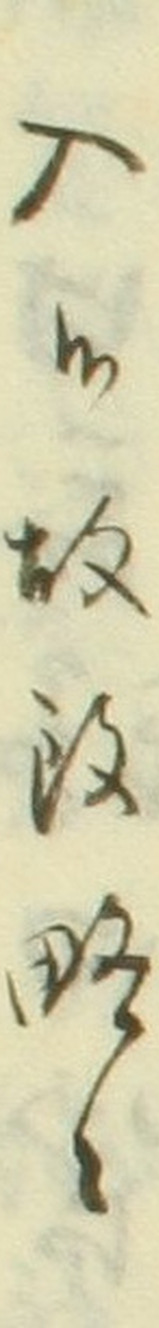入候故致略候
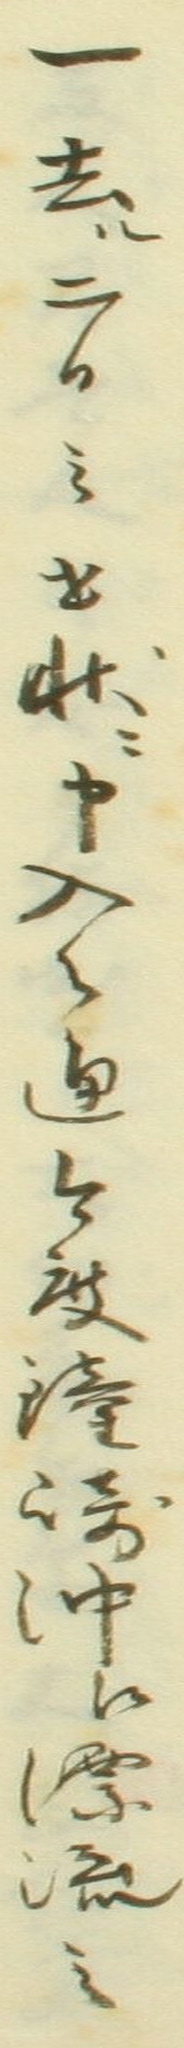一去る二日之書状に申入之通今度鐘崎沖え漂流之
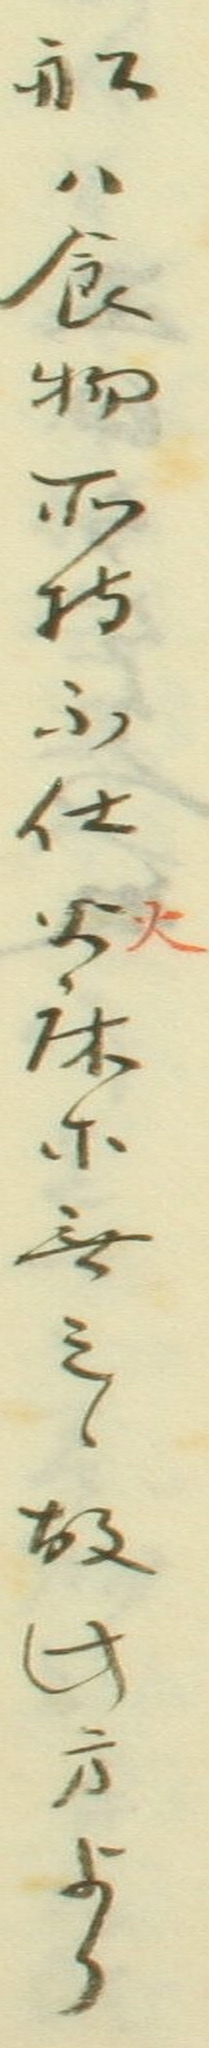船は食物所持不仕火床等無之候故此方より
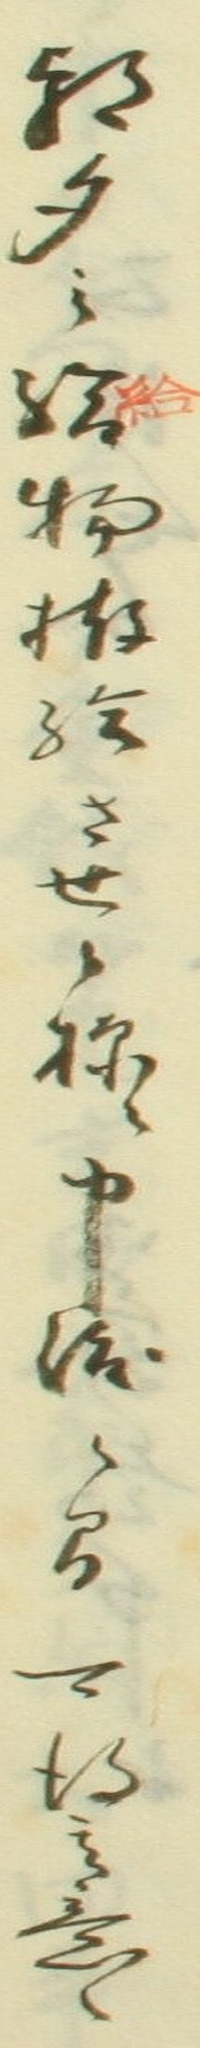朝夕之給物拵給させ候様に申渡候間可得其意候
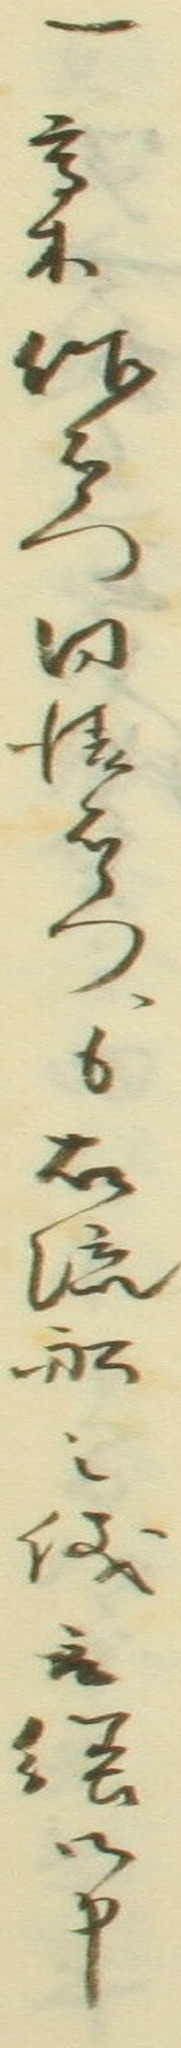一高木作右衛同清右衛門へも右流船之儀取繕御申

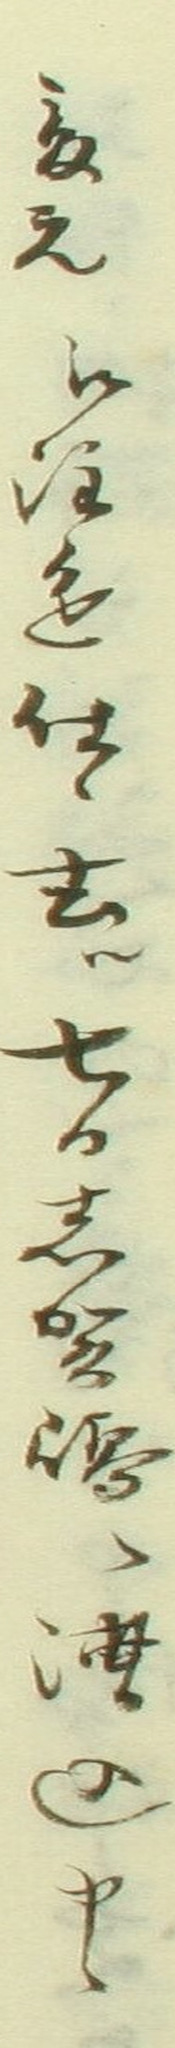爰元え注進仕候去る七日志賀島へ漕込申候
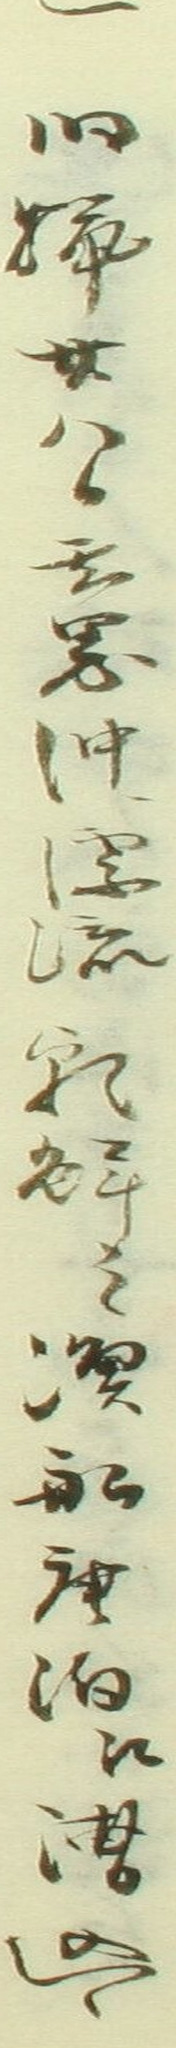一旧臘廿八日玄海沖漂流朝鮮之漁船唐泊え漕込候
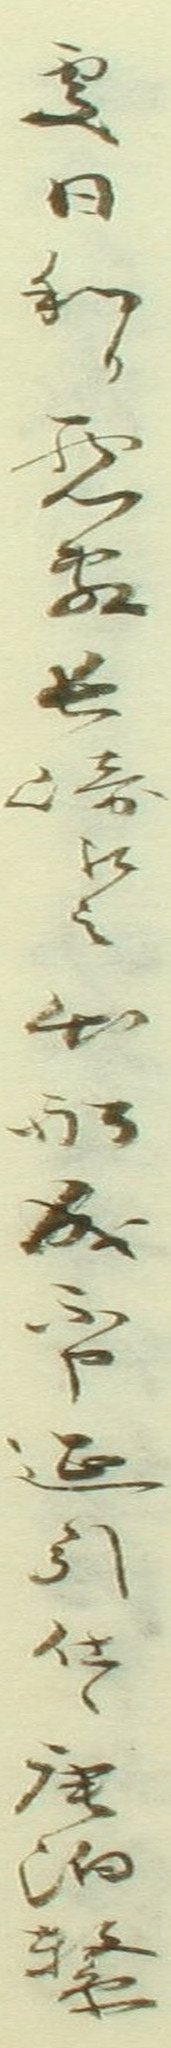処日和り悪敷長崎え之出船成不申延引仕候唐泊繋
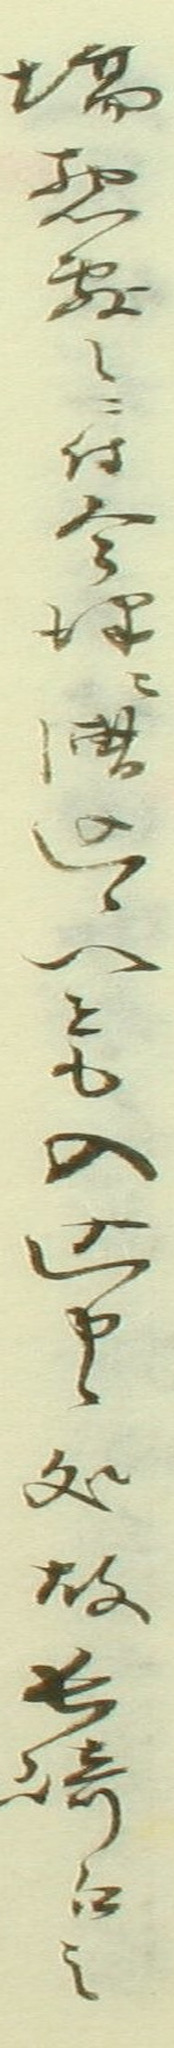場悪敷候に付今津に漕込候へとも入込申候処故長崎え之
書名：朝鮮船御領内漂流記 坤
